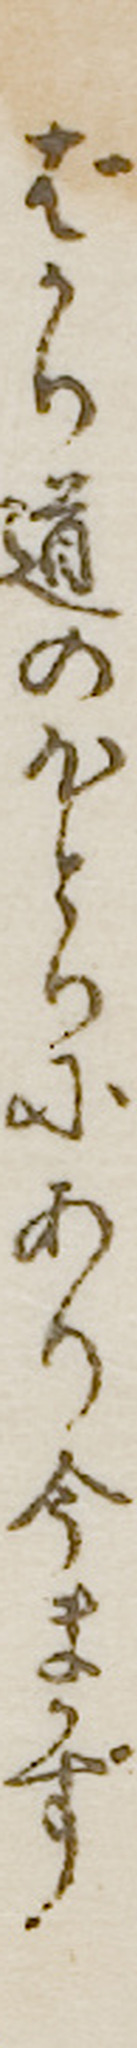ばかり道のほとりにありい今まかず
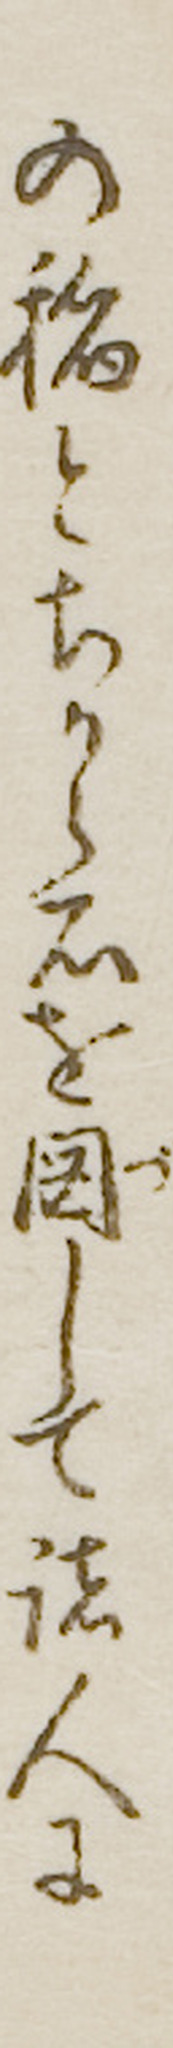の稲とちから石を図して諸人に
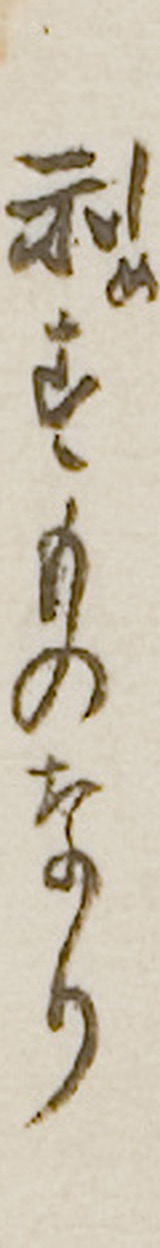示すものなり
